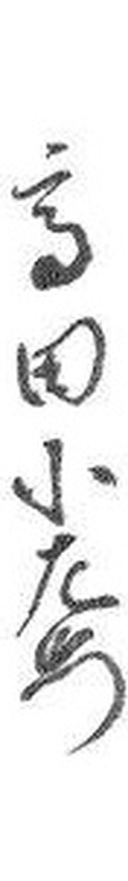高田小左衛門
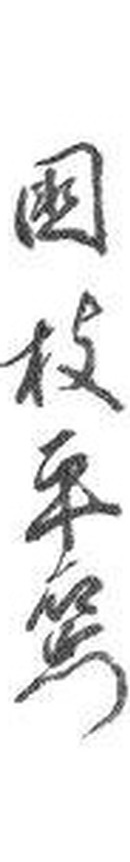国枝平右衛門
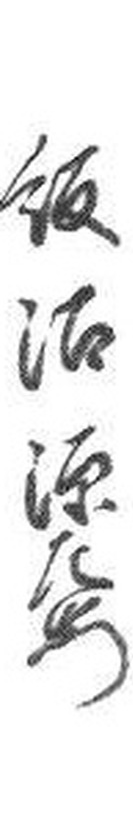飯沼源左衛門
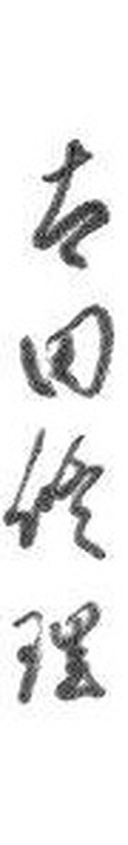太田修理
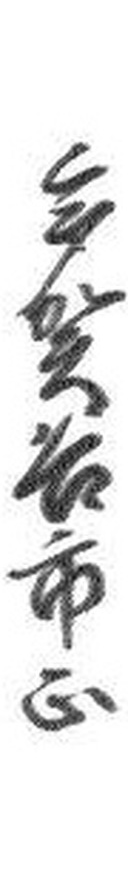多賀谷市正
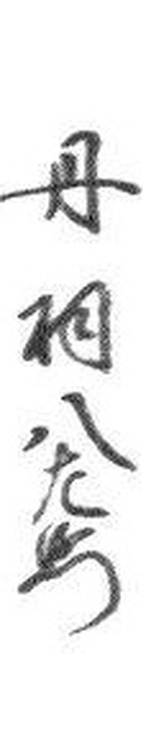丹羽八左衛門
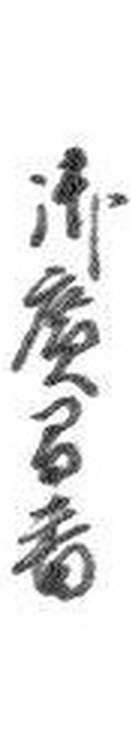御広間番
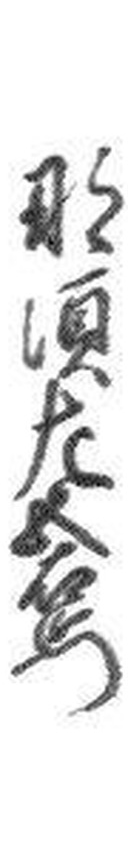那須左五右衛門
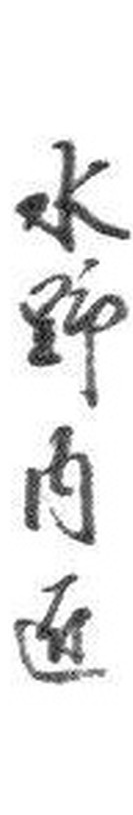水野内匠
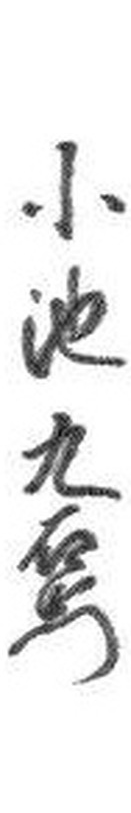小池九右衛門

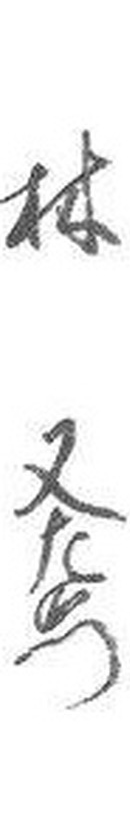林又左衛門
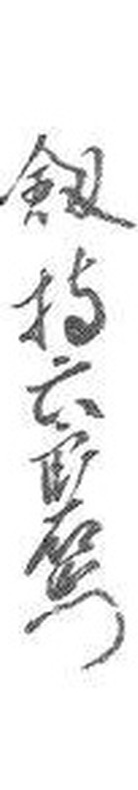剱持六郎右衛門
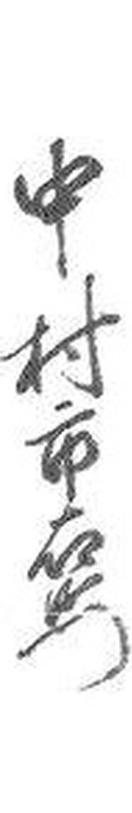中村市右衛門
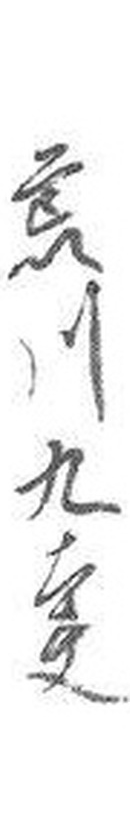荒川九太夫
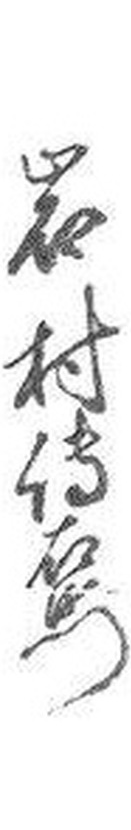岩村伝右衛門
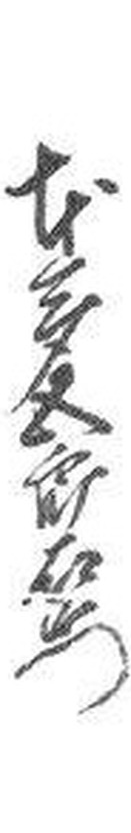本多五郎右衛門
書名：家譜 四 忠昌公 従寛永七年到正保四年
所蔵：福井県文書館 Fukui Prefectural Archives
